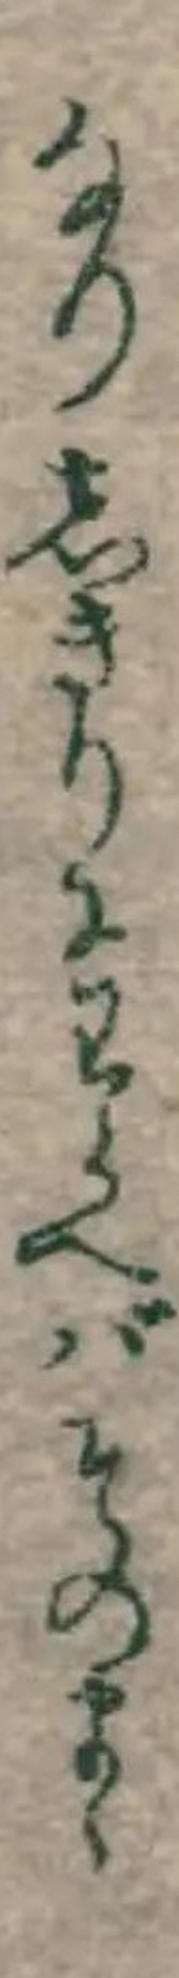なりしきりにわらへばそのまゝ

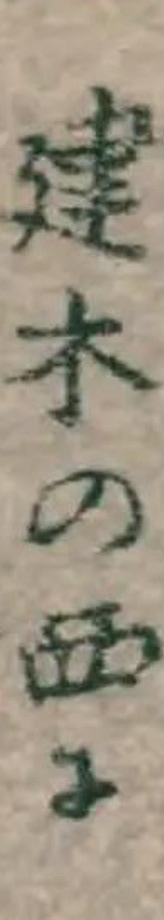建木の西に
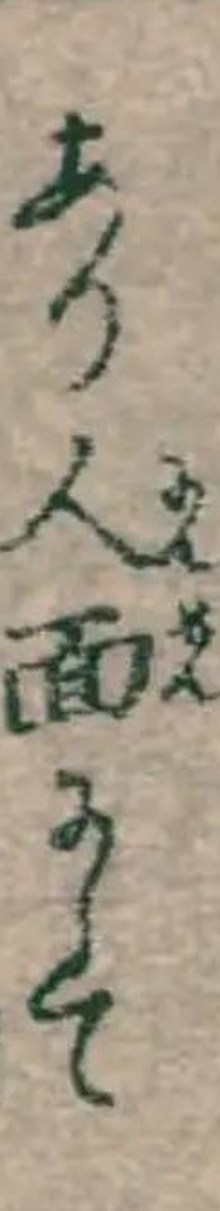あり人面にして
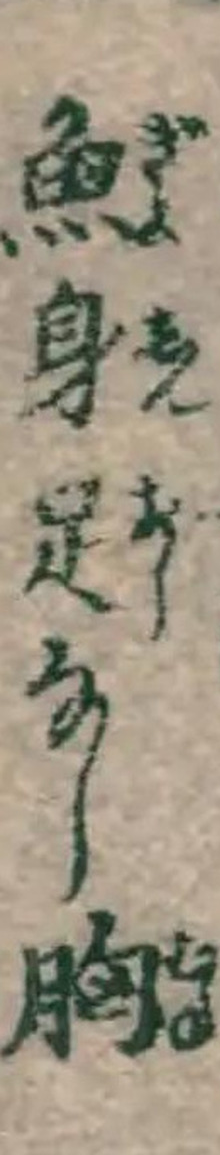魚身足なし胸
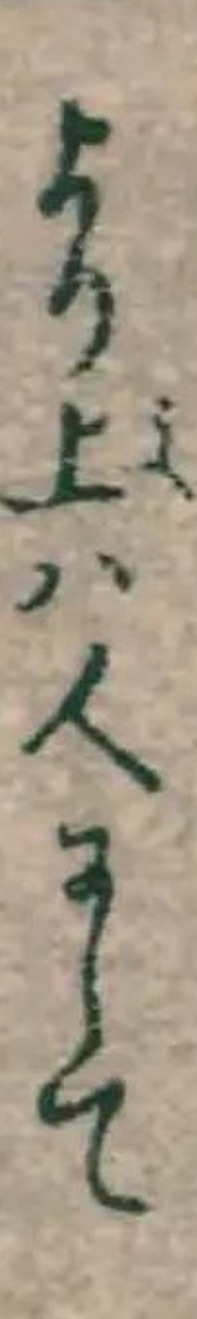より上は人にして
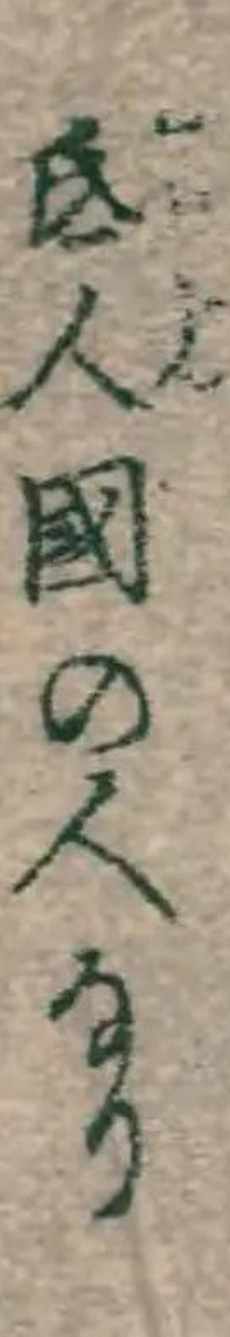氐人国の人なり
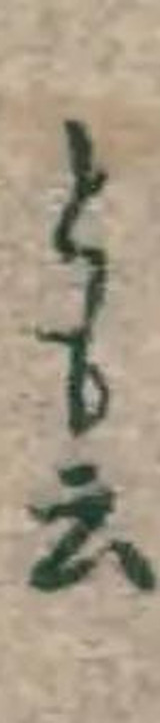とも云
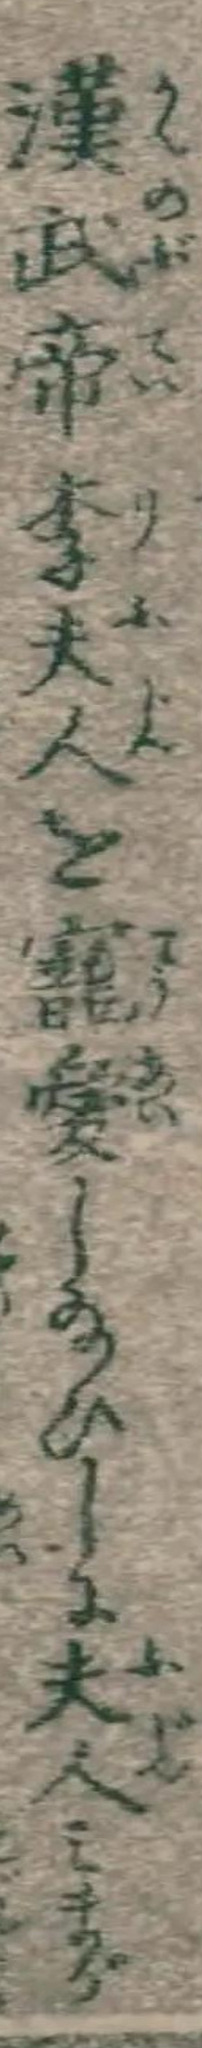漢武帝李夫人を寵愛し給ひしに夫人みまが
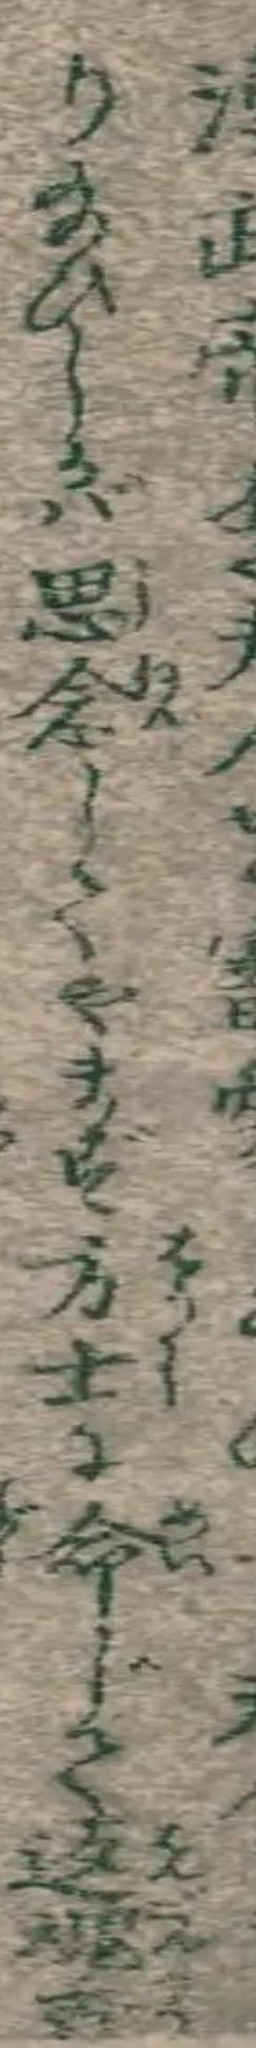り給ひしかば思念してやまず方士に命じて返魂香
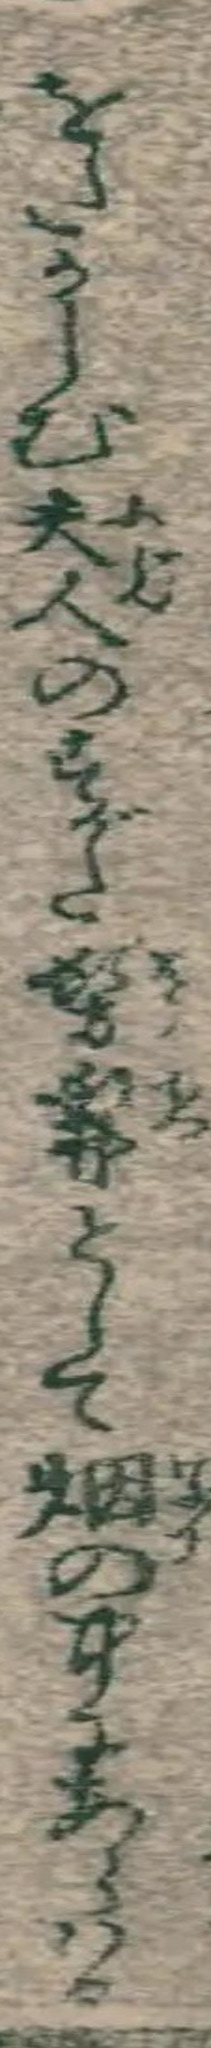をたかしむ夫人のすがた髣髴として烟の中にあらはる
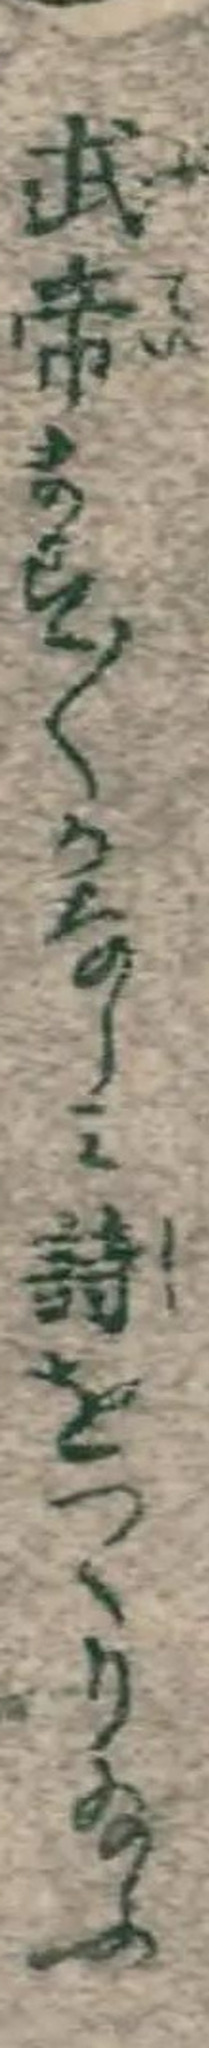武帝ます〳〵かなしみ詩をつくり給ふ
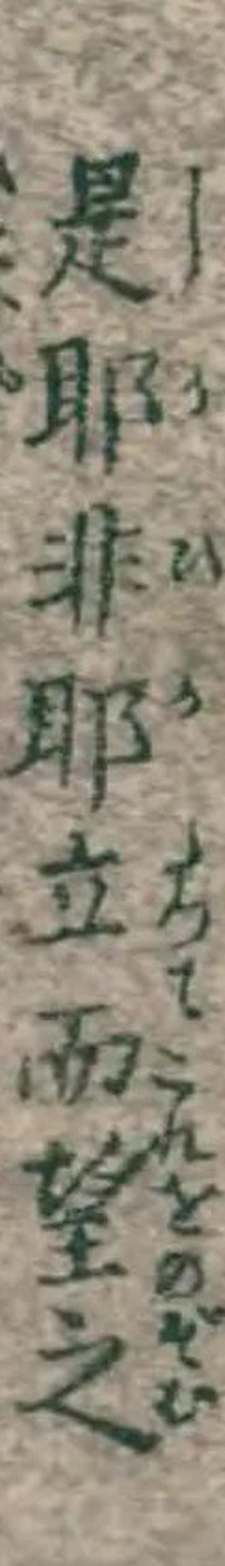是耶非耶立而望之
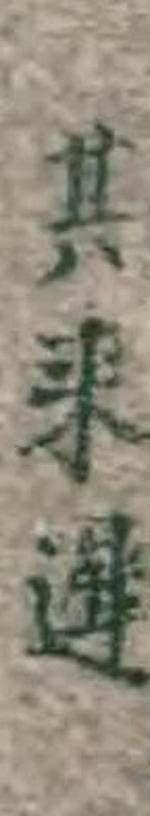其来遅

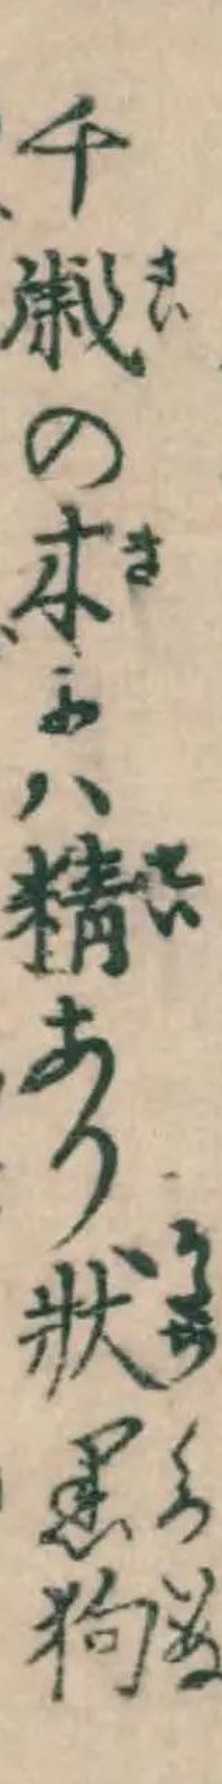千歳の木には精あり状黒狗
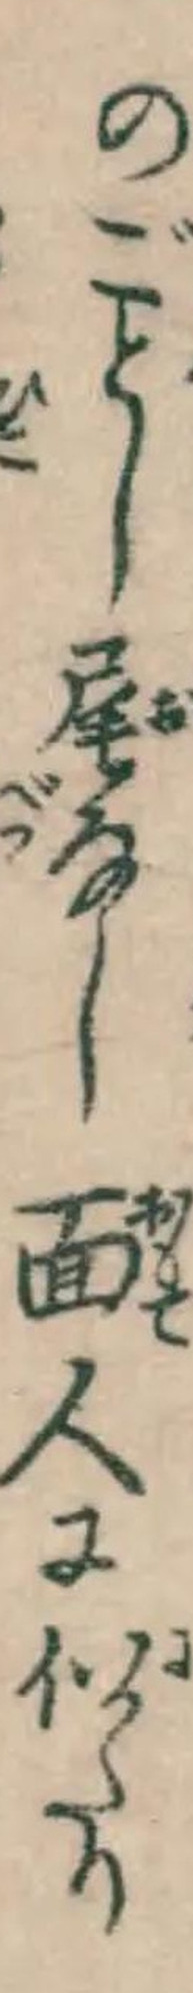のごとし尾なし面人に似たり
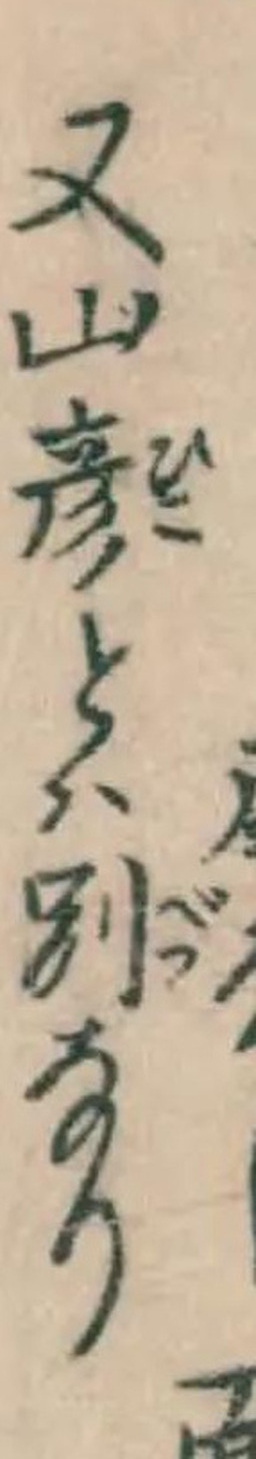又山彦とは別なり
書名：百鬼夜行 3巻拾遺3巻. [2]
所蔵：国立国会図書館 National Diet Library, JAPAN
